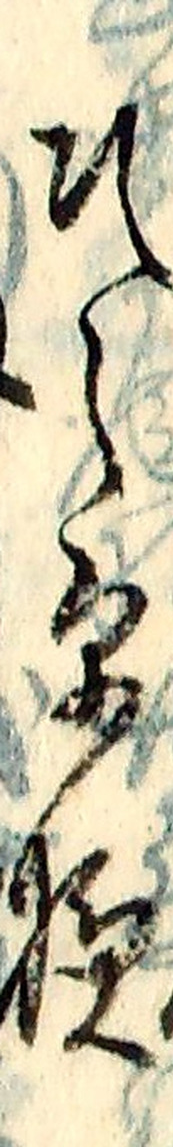次郎兵衛様
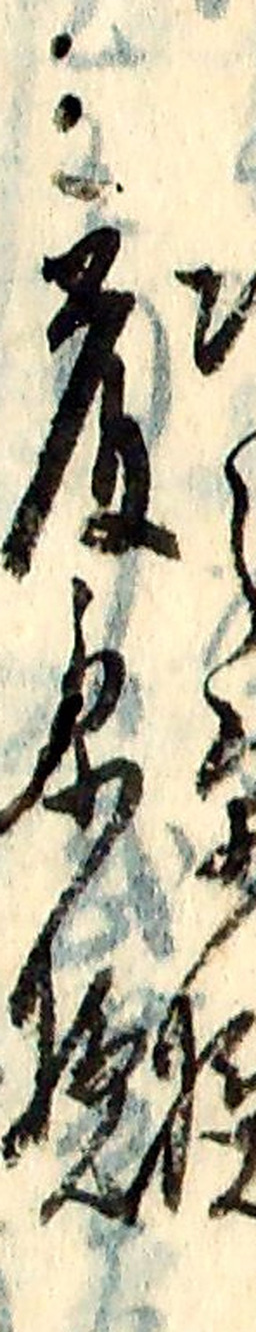藤兵衛様
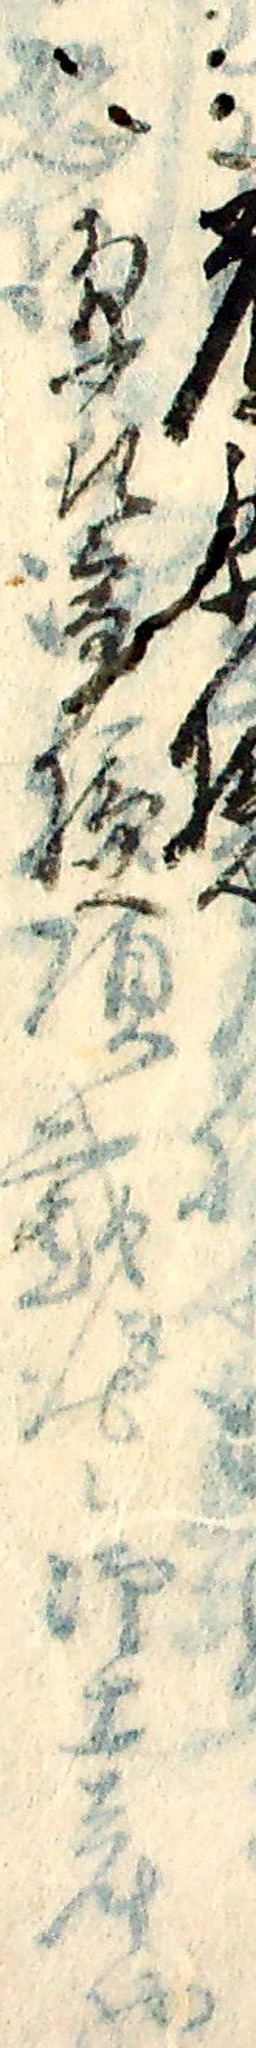索次郎様
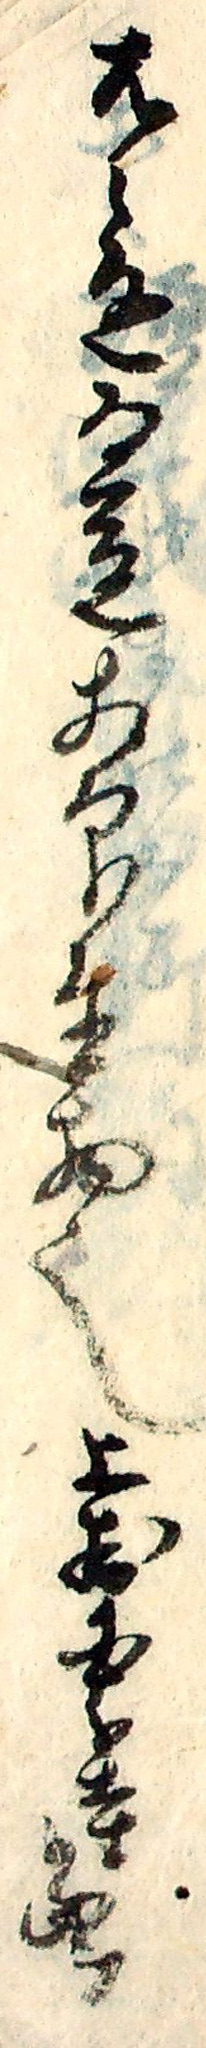右之通為送相印置物也上封国分寺当て

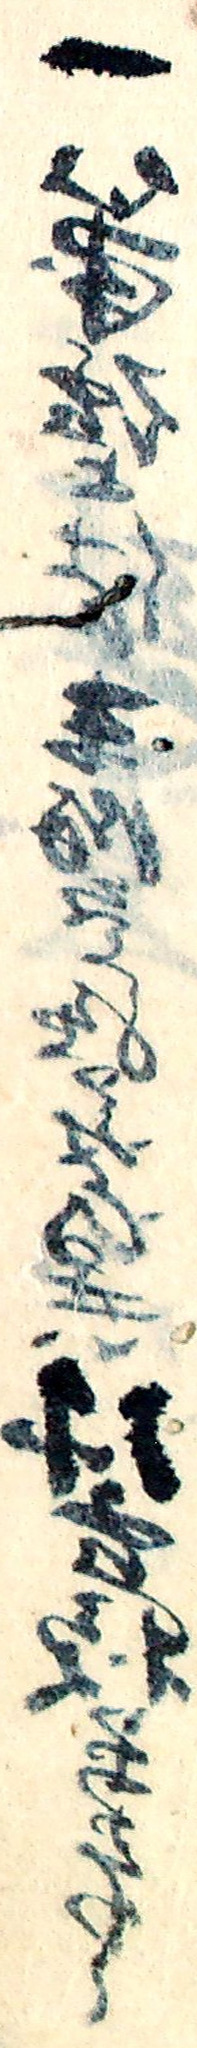三月十一日
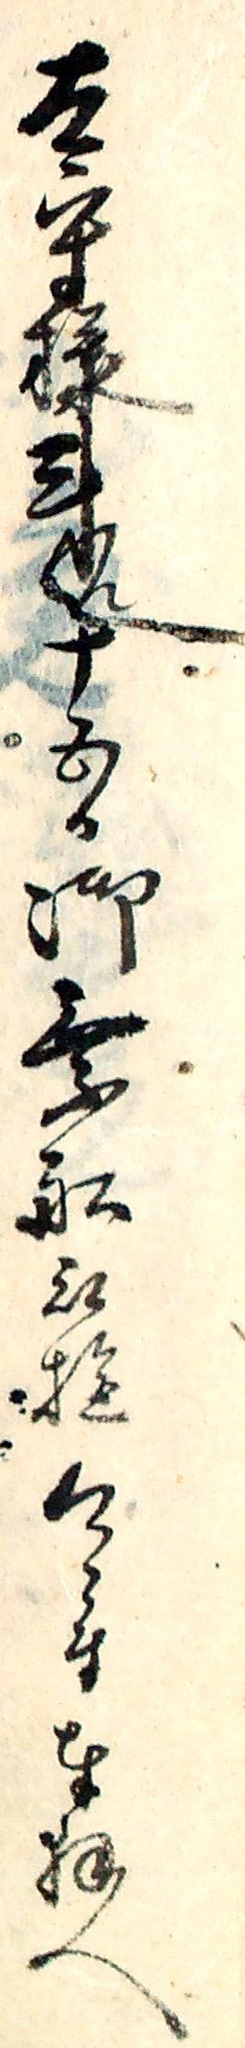太守様来る十五日御乗船被遊候に付奉拝へ
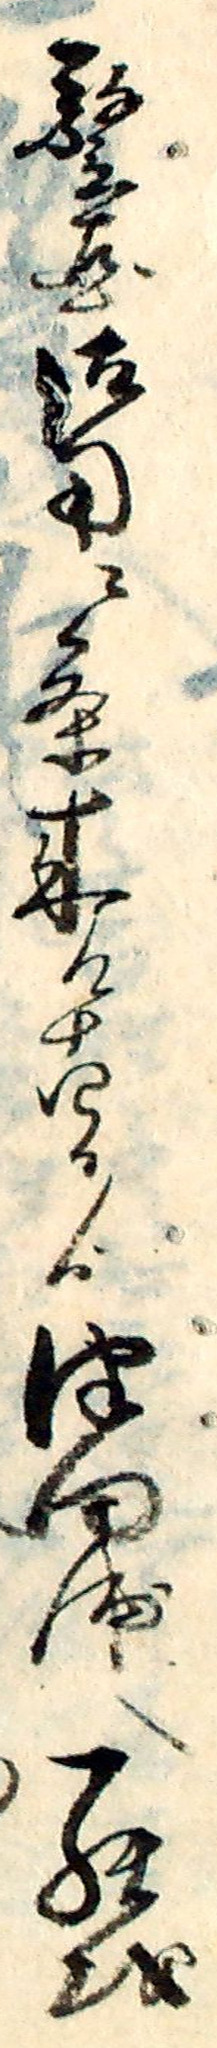警固御用に候条来る十四日ゟ津田浦へ罷越
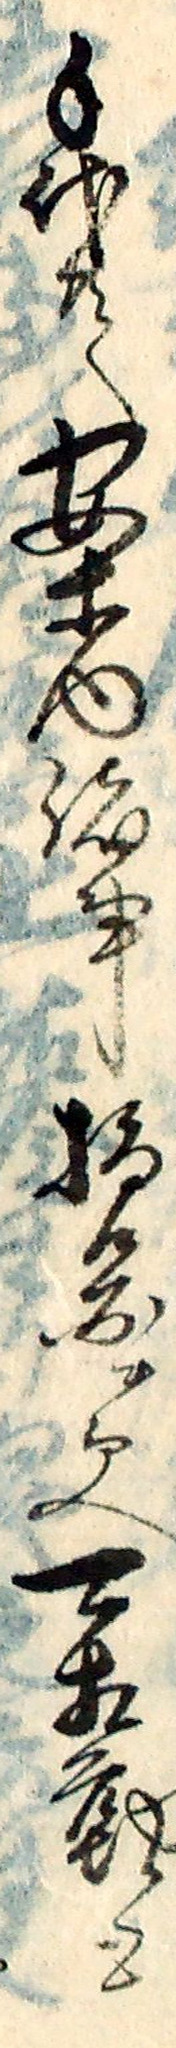手代共へ案内諸事指図を受可相勤候以上
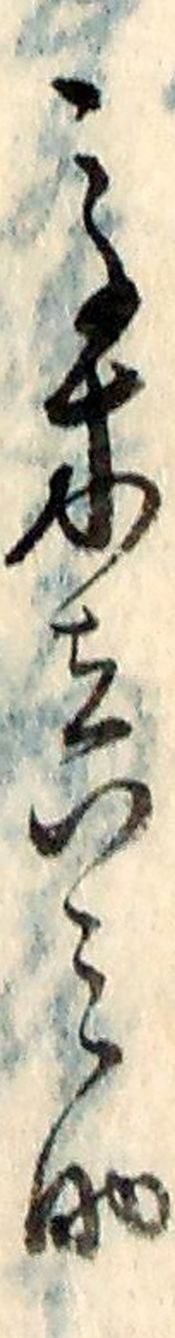高木真之助
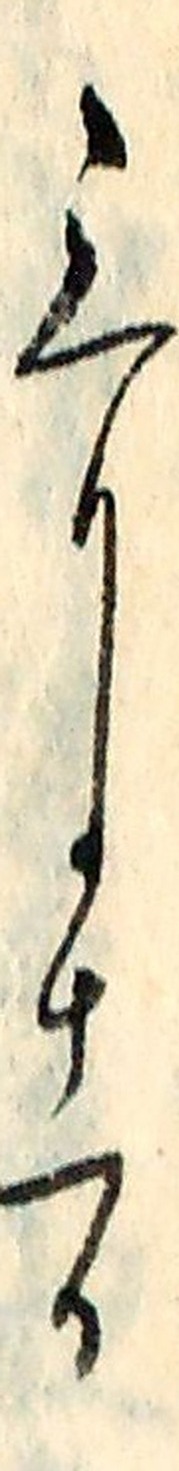三月十一日
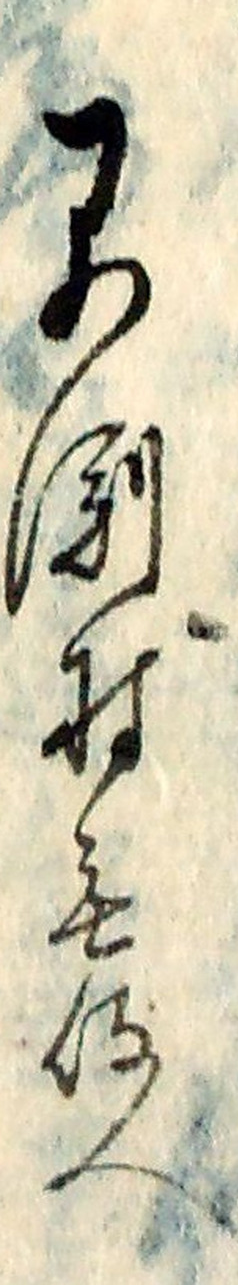早淵村無役人
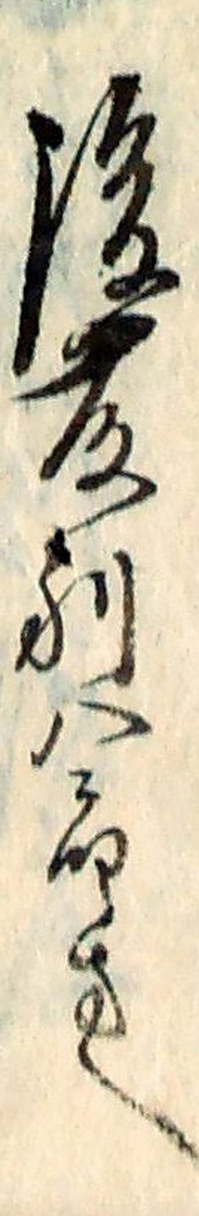後藤利八郎方へ
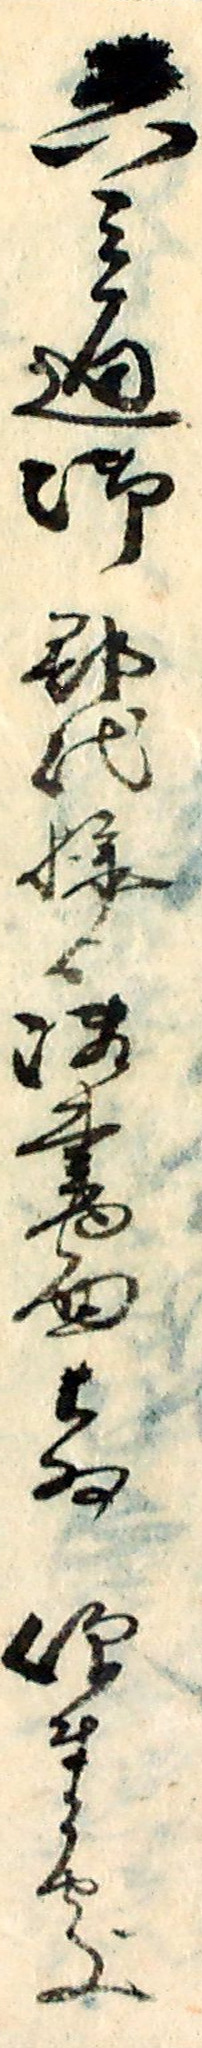右之通御郡代様ゟ御書面被為仰付候処
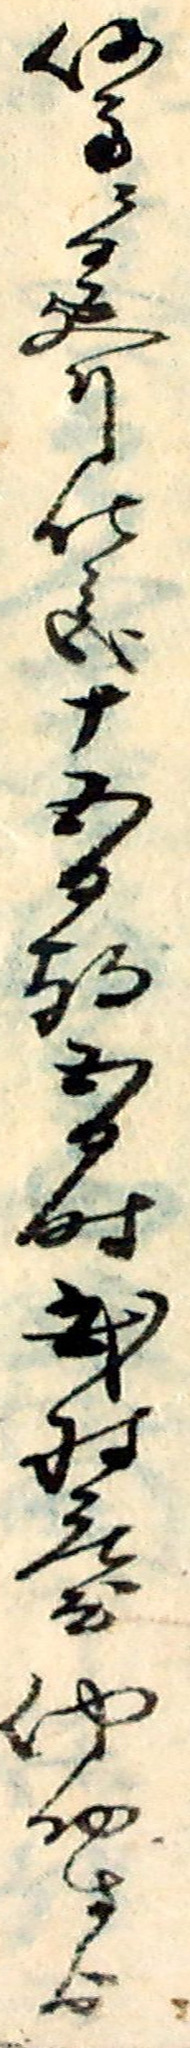何方にて延引仕候哉十五日朝五つ時当村庄屋仲助方ゟ
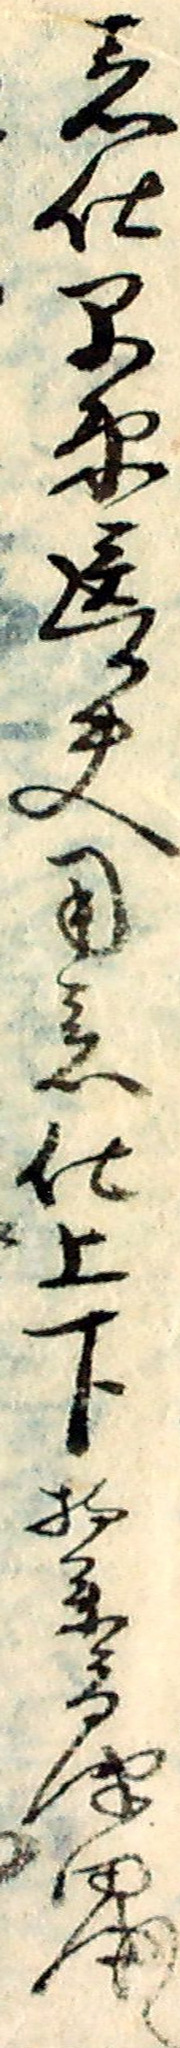着仕早束送り夫用意仕上下持参にて津田浦へ
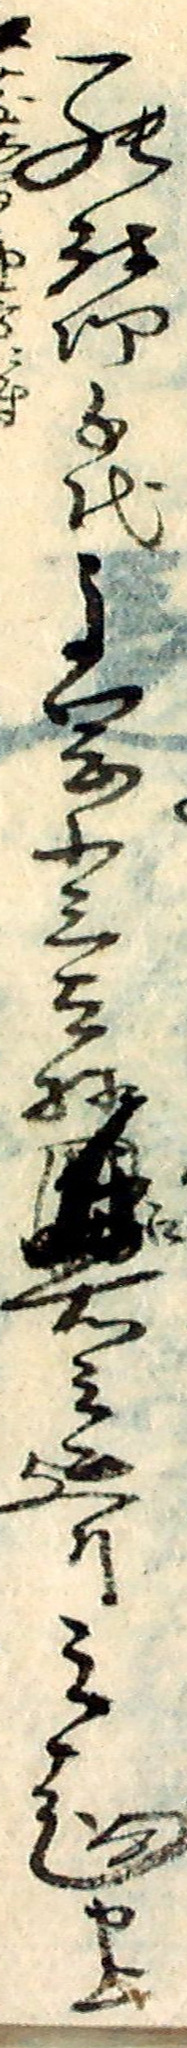罷越御手代高岡小三太様え右之延引之趣申上
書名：諸御願書控(後藤氏壱番）
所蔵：鳴門教育大学 Naruto University of Education
